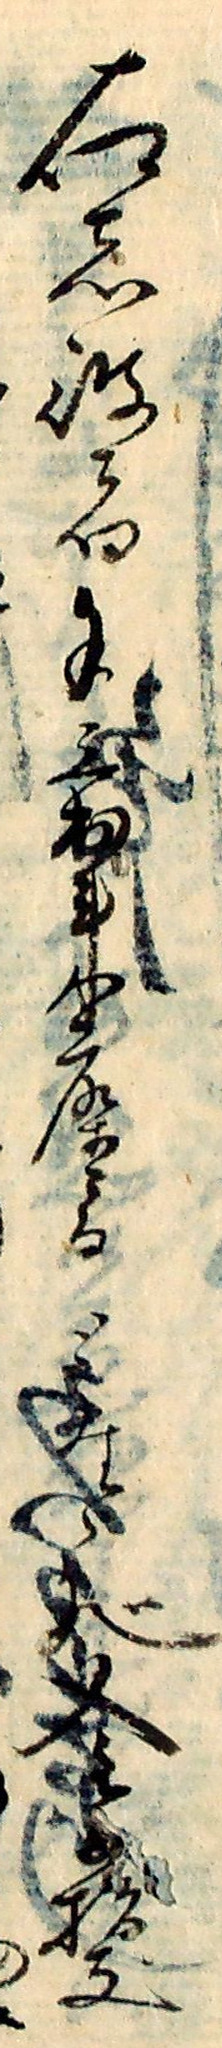右は彼者手之出来蒅にて御座候処金子指支
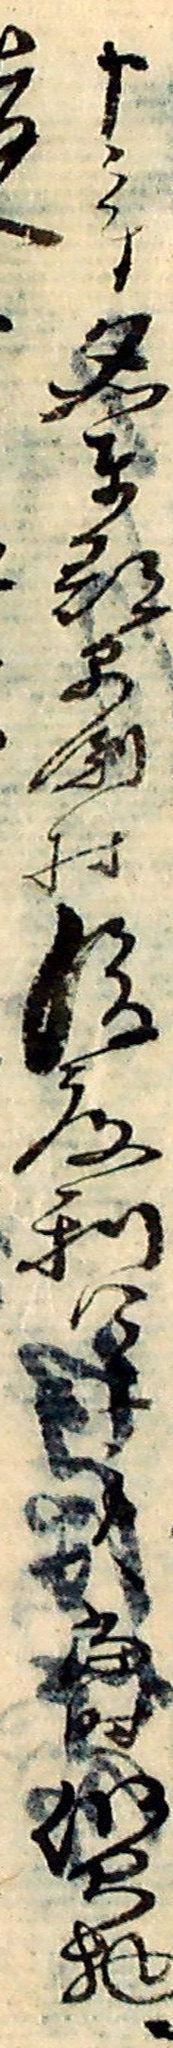申に付名東郡早淵村後藤利八郎方へ当時質物に
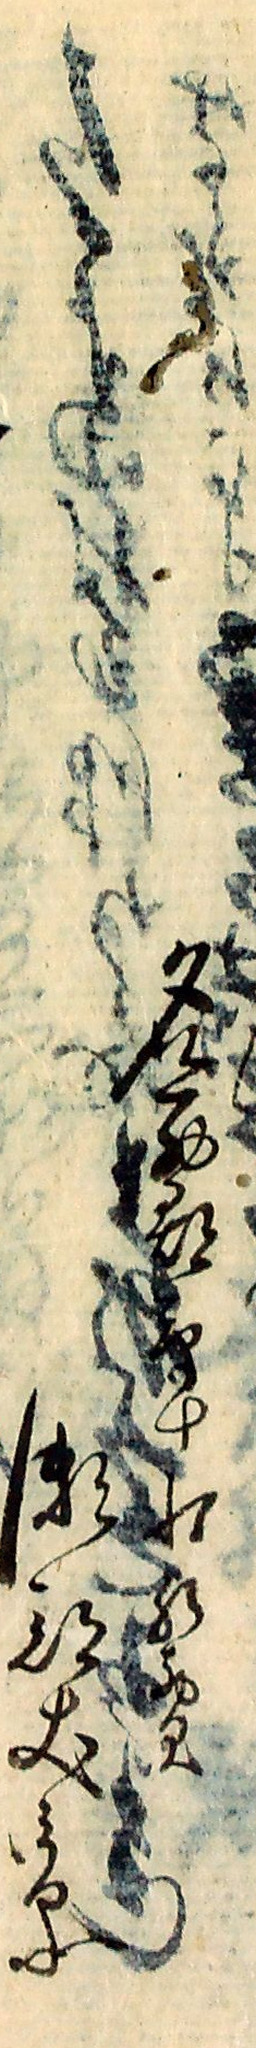瀬部丈兵衛
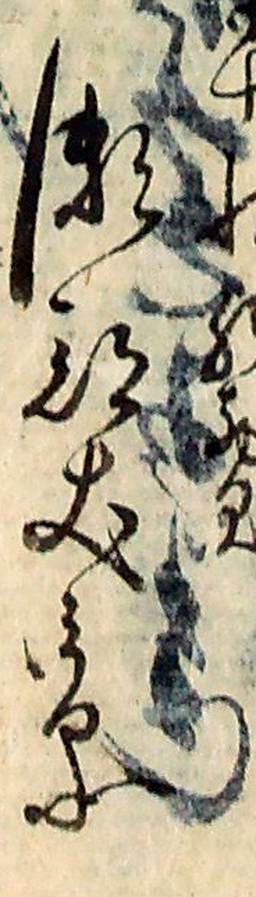瀬部丈兵衛
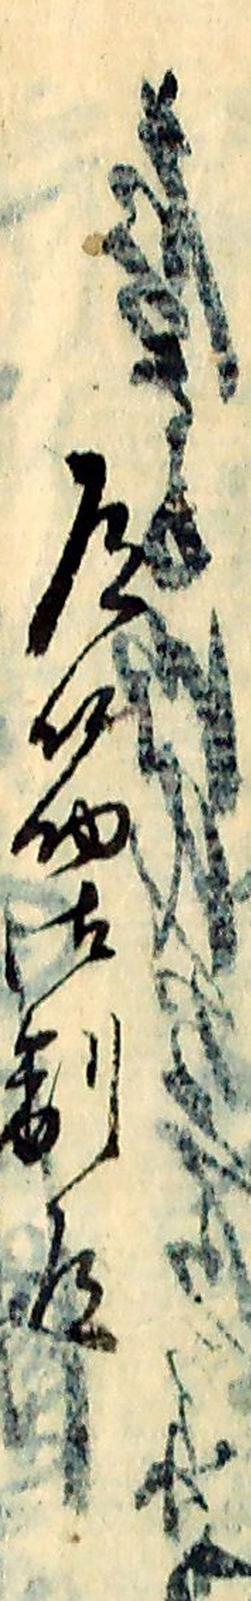道筋御制道
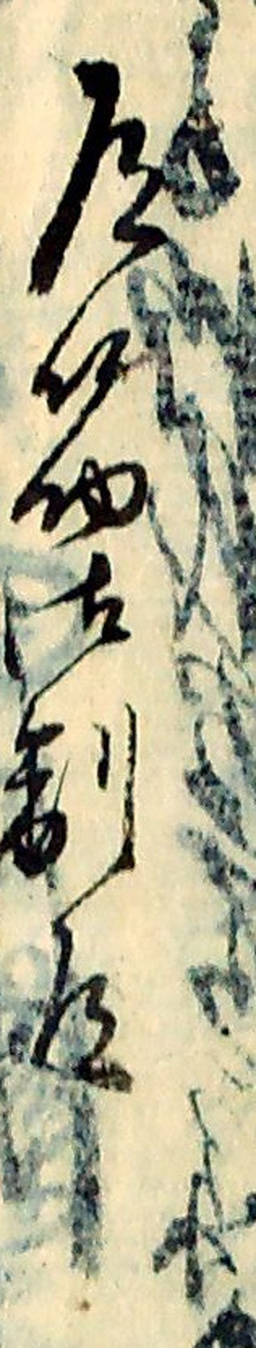道筋御制道
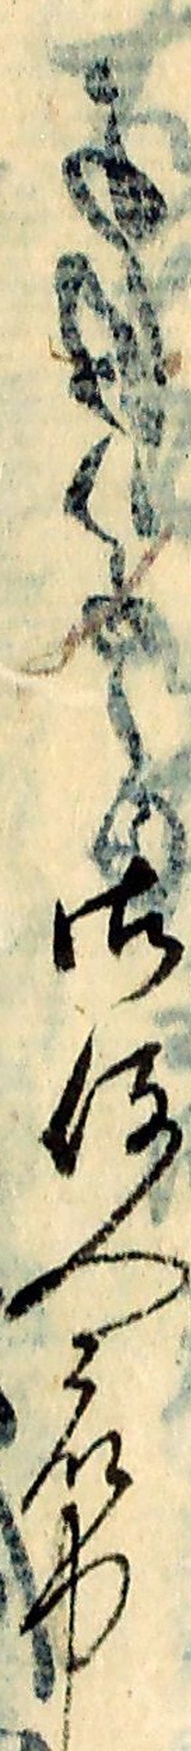御役人衆中

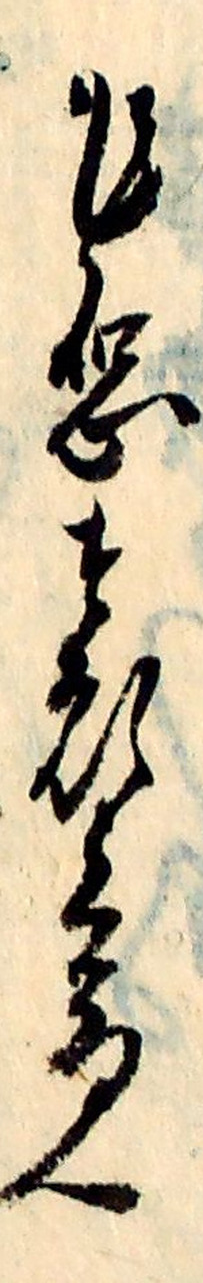乍恐奉願上覚
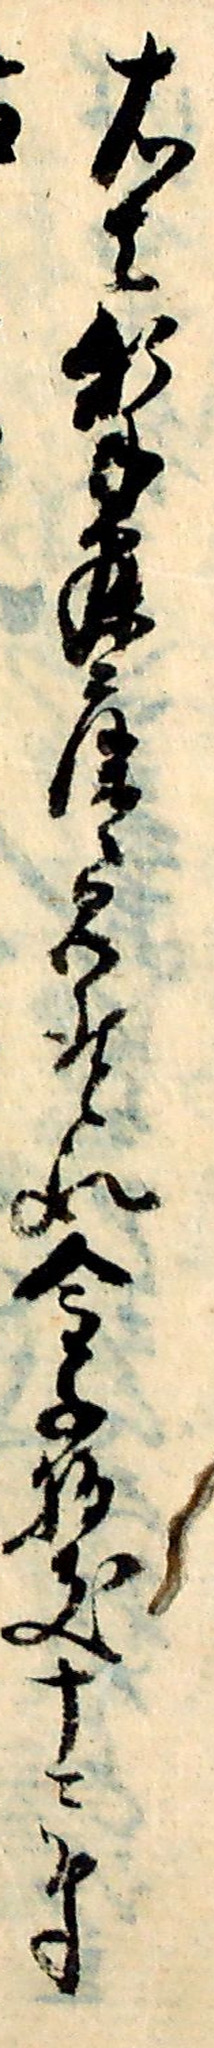右は私手寐蒅にて御座候処金子指支申に付
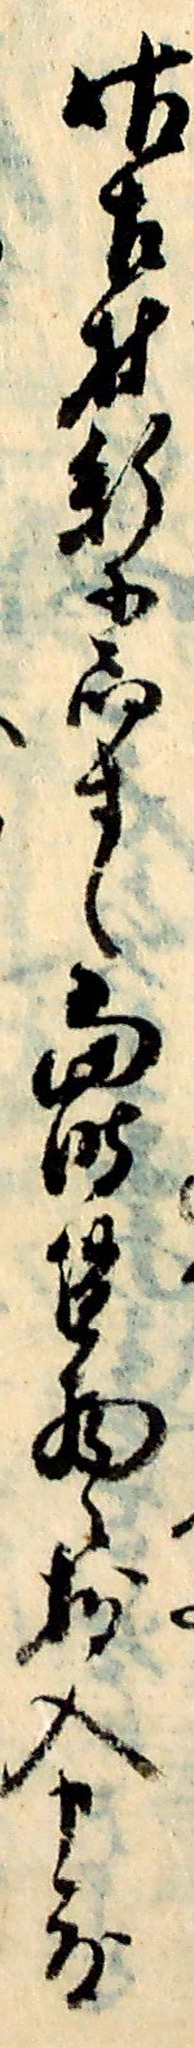佐古村新五郎方へ当時質物に指入申度
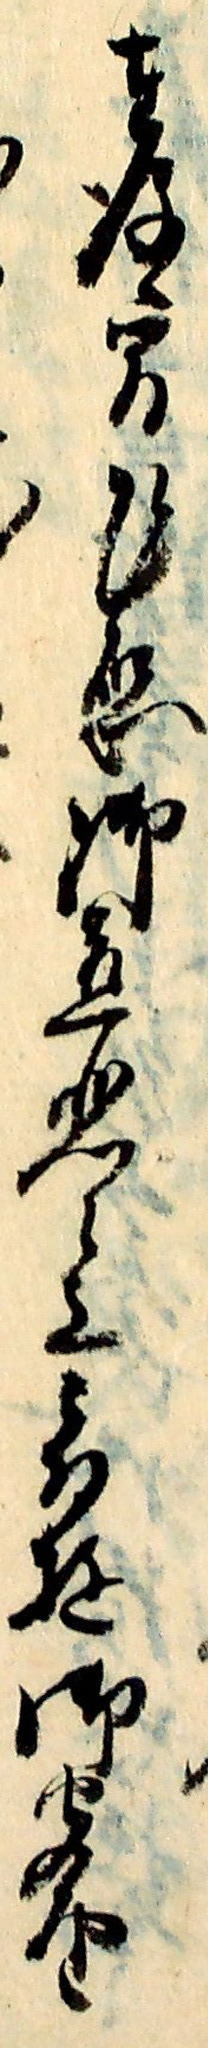奉存候間乍恐御慈悲之上被為遊御聞届
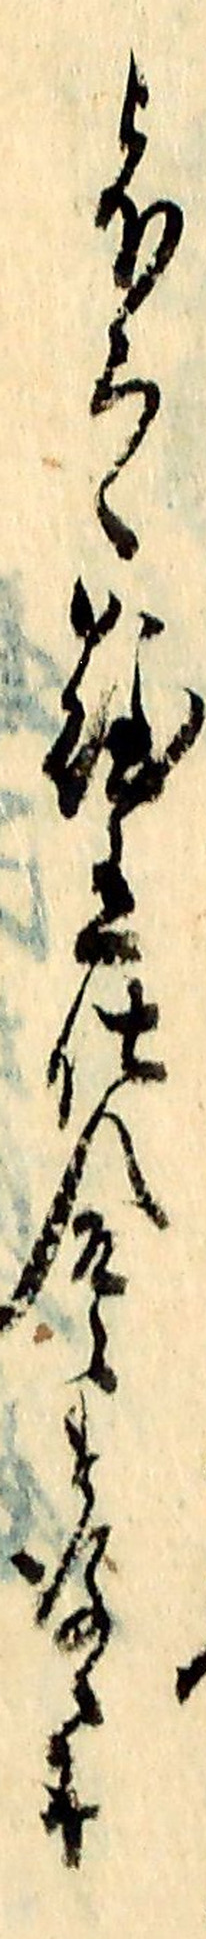被下候はゝ難有仕合に奉存候以上
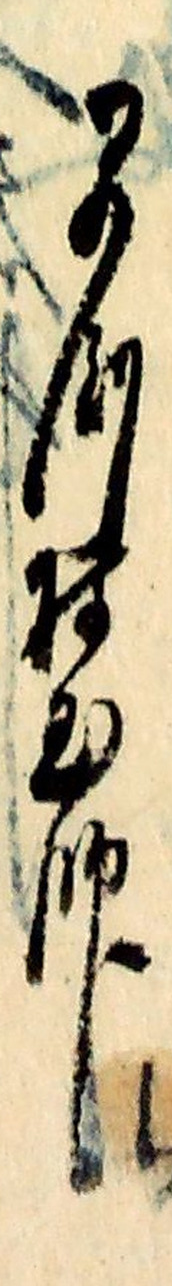早淵村玉師
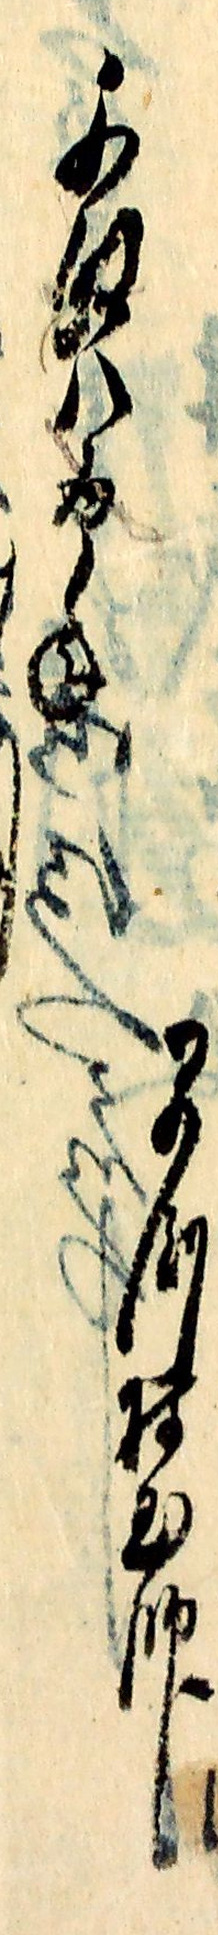早淵村玉師
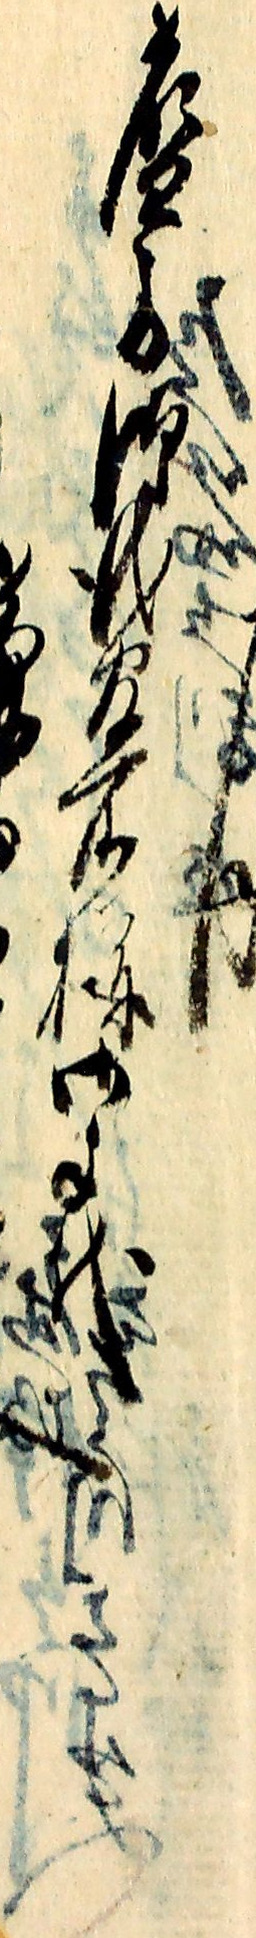藍方御代官所様御手代
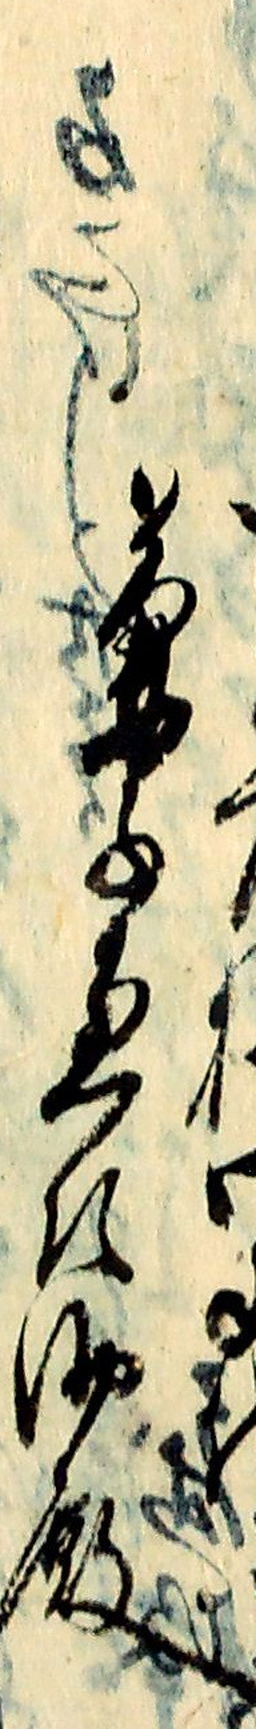兼子恵次助殿
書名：諸御願書控(後藤氏壱番）
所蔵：鳴門教育大学 Naruto University of Education
